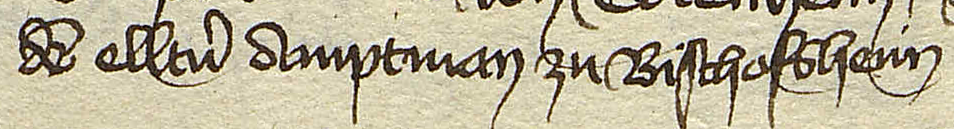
de* elltn* Amptman ʒu Biſchofsheim
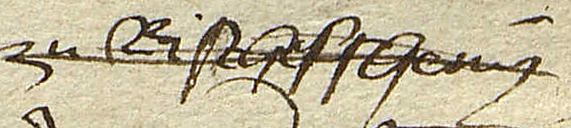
ʒu Biſchofſheim
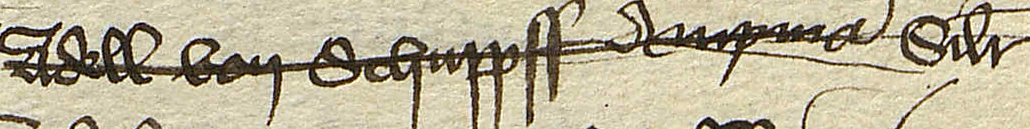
Adell von Schuppff Ampma* Silr*
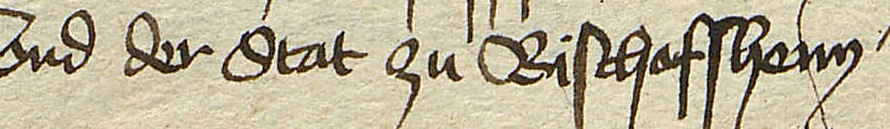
vnd der Stat cʒu Biſchofſheim /
